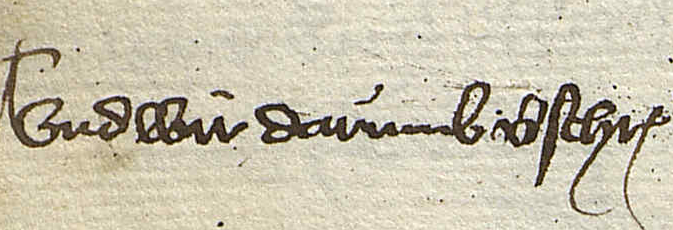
vnd wir darümb v*ſchr*
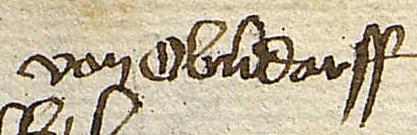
von Obn*dorff
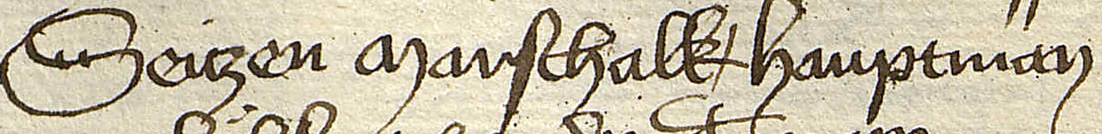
Seicʒen Marſchalk hauptman
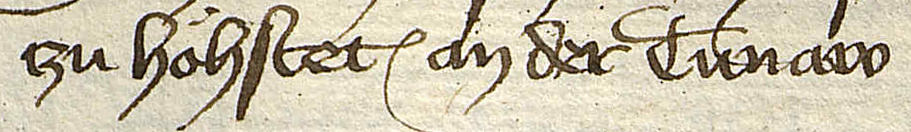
cʒu höhſtet* an der Tunaw
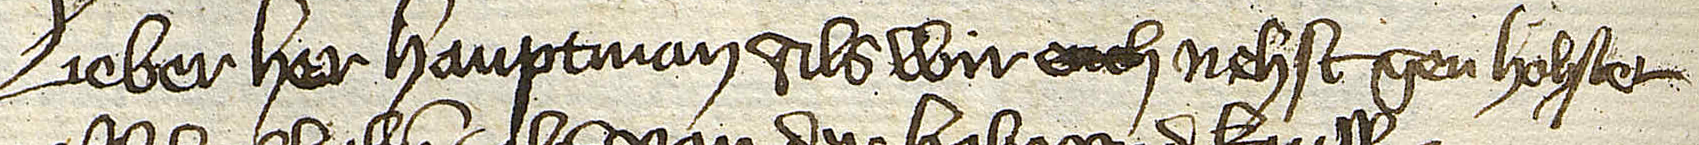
Lieber her hauptman Als wir euch nehſt gen höhſtet
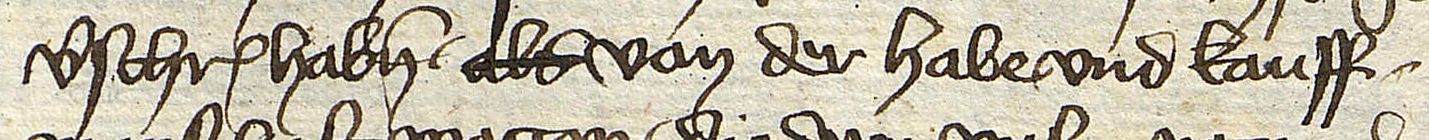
v*ſchr* habn* / als von der habe vnd kauff =
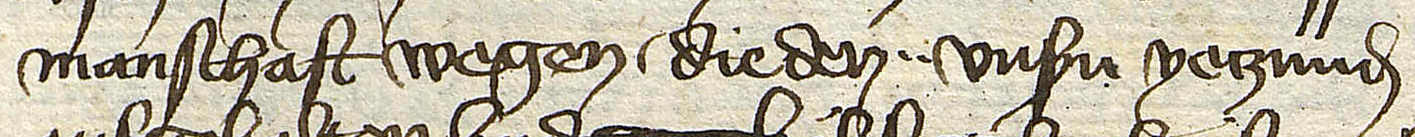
manſchaft wegen / die den ~ vnſ*n yecʒund*
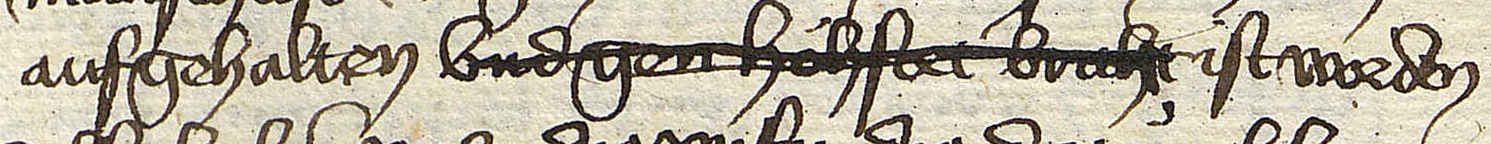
aufgehalten vnd gen höhſtet braht iſt worden
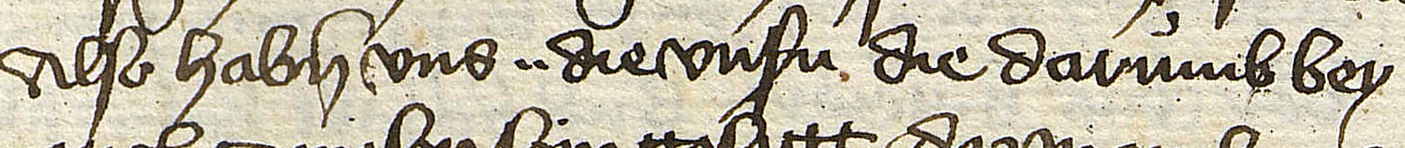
Alſo habn* vns ~ die vnſ*n die darümb bey
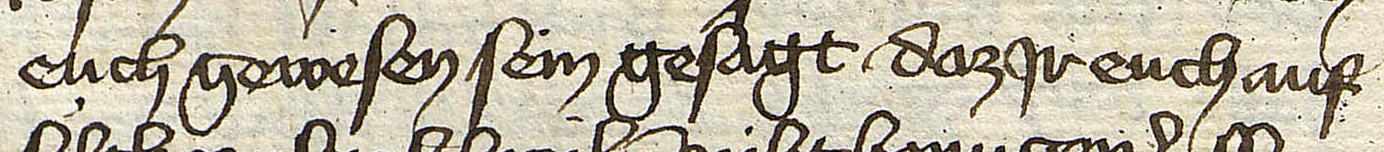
euch geweſen ſein geſagt / daʒ Ir euch auf
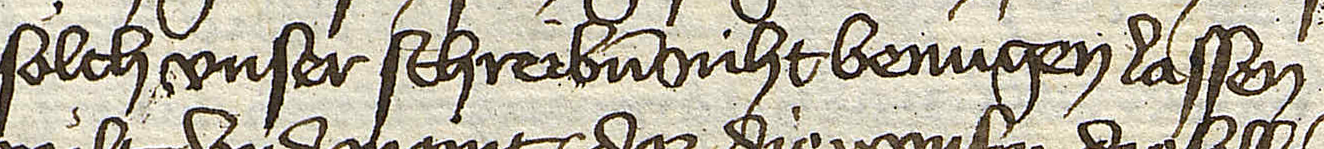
ſölch vnſer ſchreibn* niht benugen laſſen
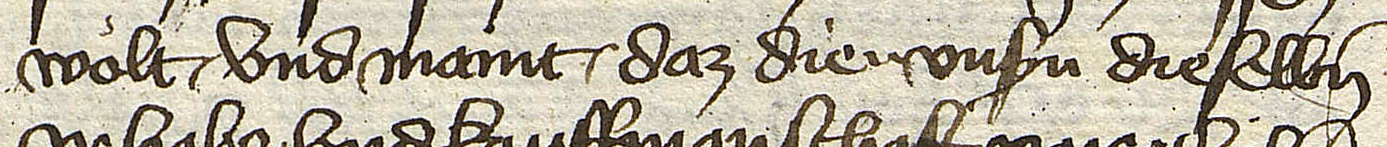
wölt / vnd maint / daʒ die ~ vnſ*n dieſelbn*
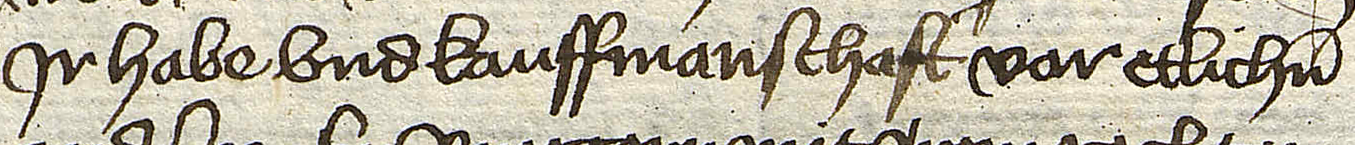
Ir habe vnd kauffmanſchaft vor etlichn*
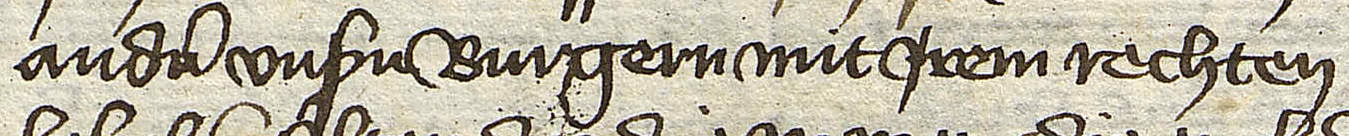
andn* vnſ*n Burgern mit Irem rechten
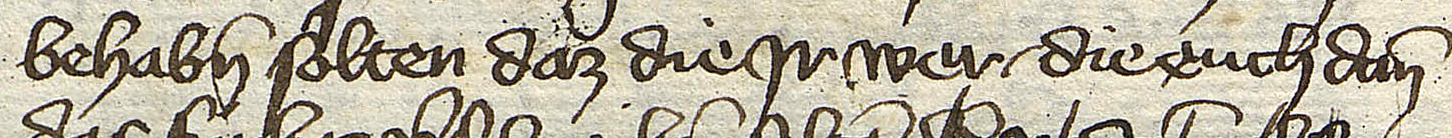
behabn* ſölten daʒ die Ir wer / die euch dan*
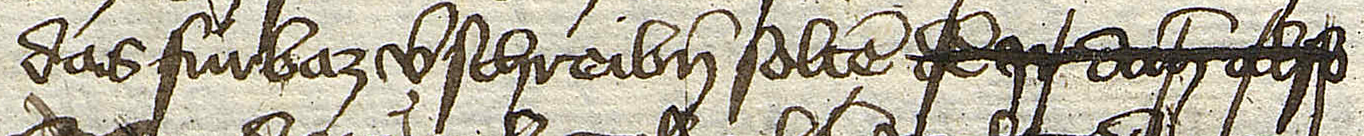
das fürbaʒ v*ſchreibn* ſolte* de* Ir dan* alſo
